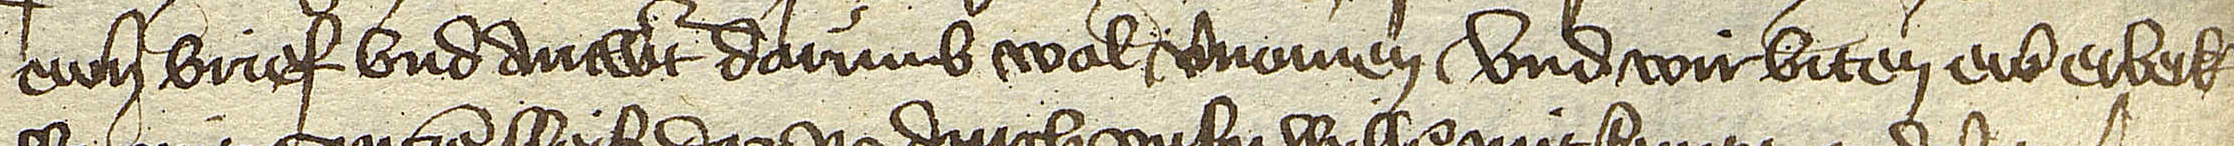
ewn* brief vnd Antwt* darümb wol v*nomen / vnd wir biten ew* erberk*
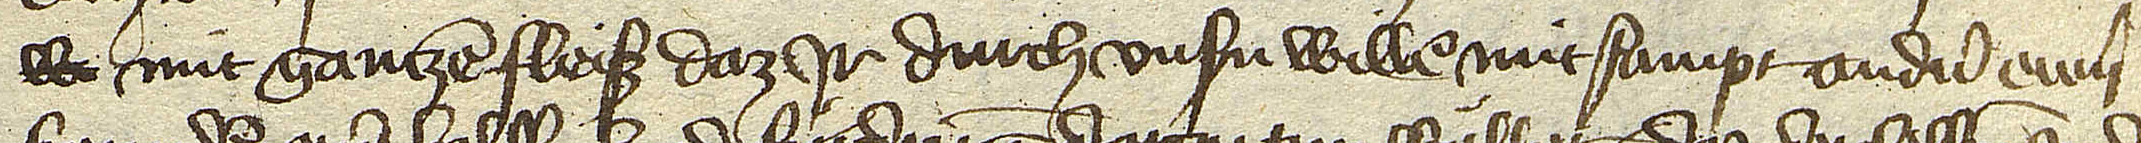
w mit gancʒe* fleiſʒ daʒ Ir durch vnſ*n wille* mitſampt andn* ewn*
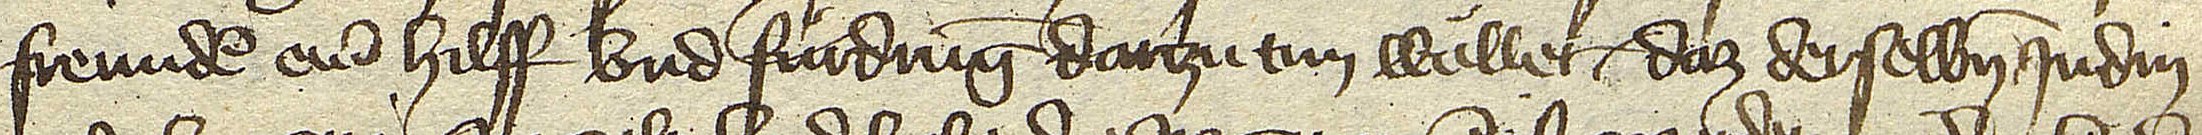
freunde* ew* hilff vnd fürdrug* darcʒu tun wöllet / daʒ derſelbn* Iudin
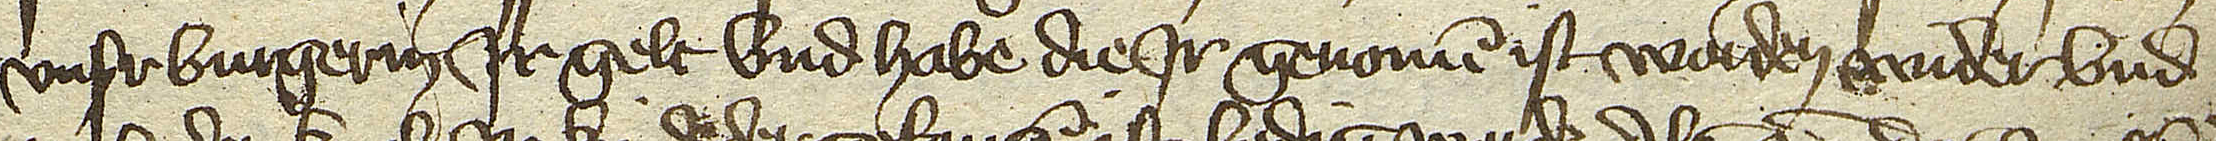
vnſ*r burgerin Ir gelt vnd habe die Ir genome* iſt worden wider vnd
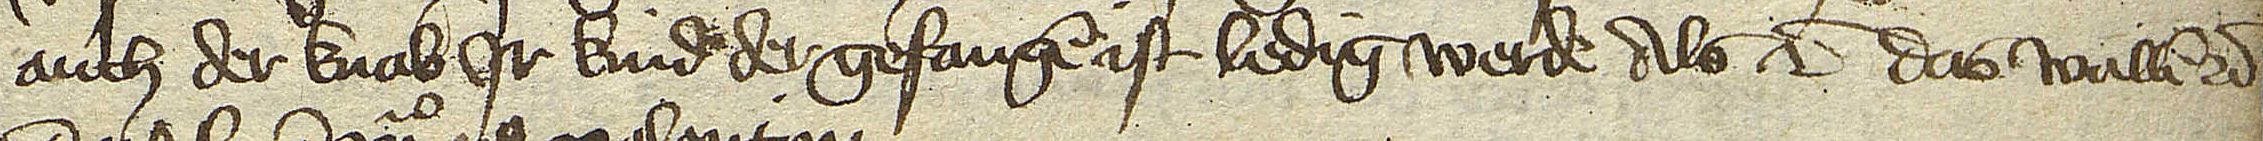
auch der knab Ir kind der gefange* iſt ledig werde Als ec* das wolle* ec*
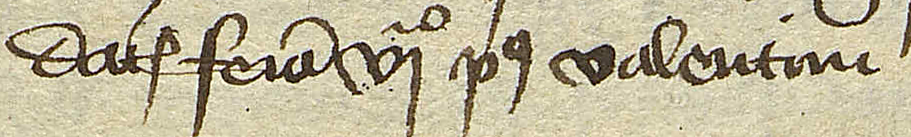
Dat* feia* vi* p* valentini
